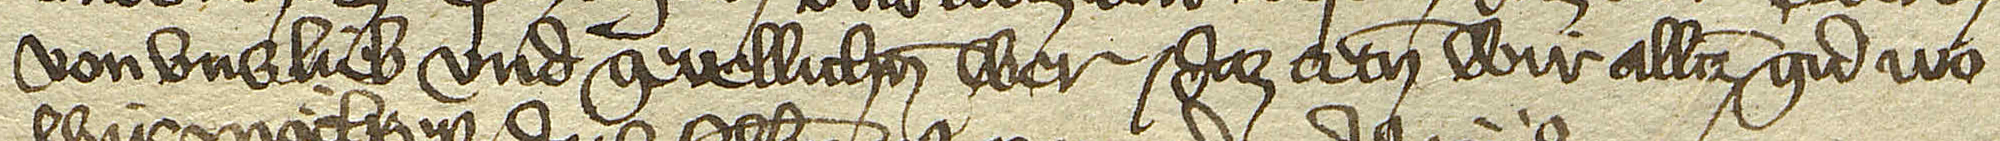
von vns lieb vnd gevellichn* wer / daʒ tetn* wir allcʒ* gn* wo
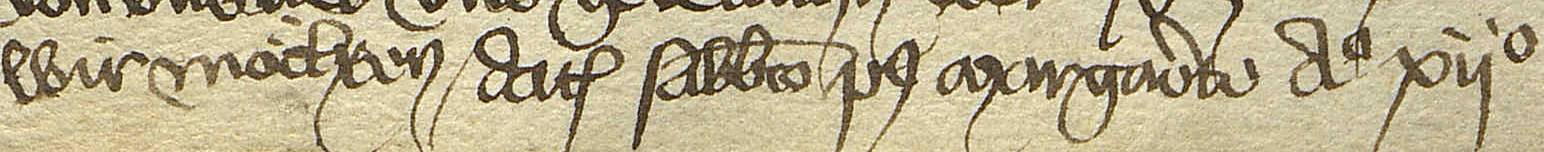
wir möchten / dat* ſabbto* p* Margar*te A* xii*
